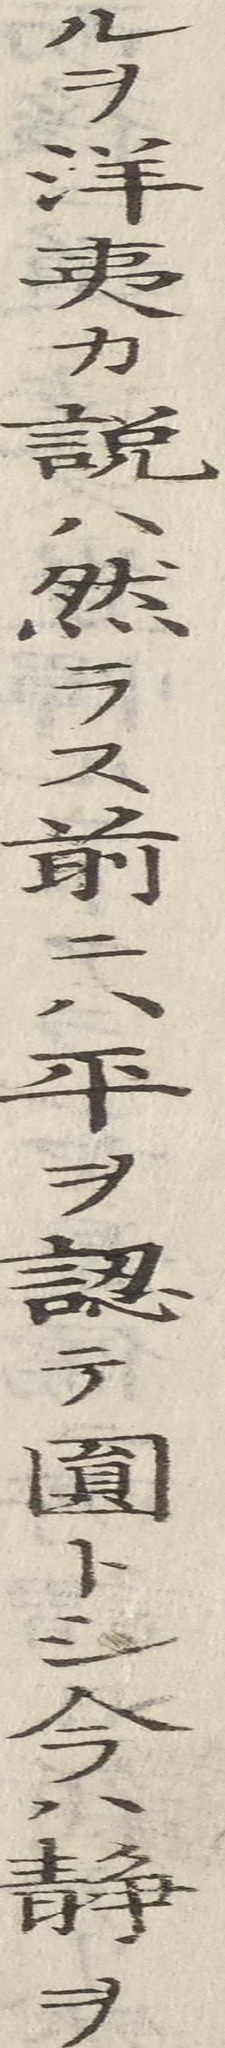ルヲ洋夷カ説ハ然ラス前ニハ平ヲ認テ円トシ今ハ静ヲ
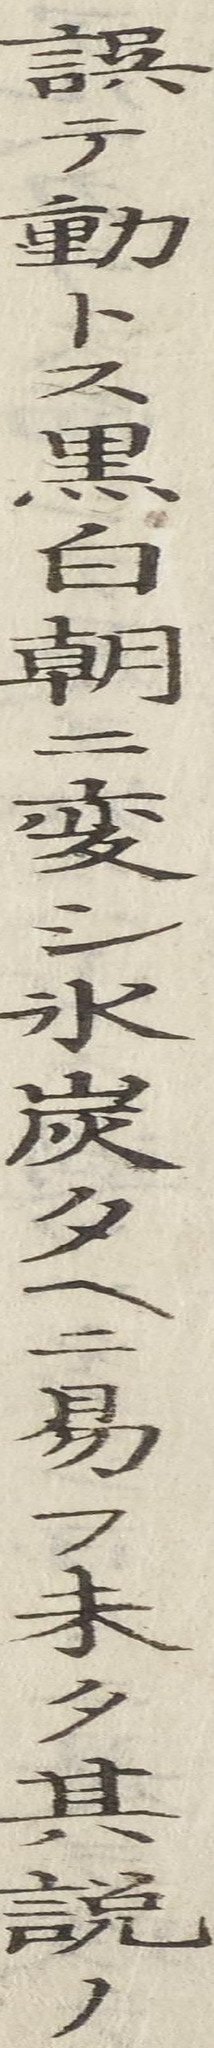誤テ動トス黒白朝ニ変シ氷炭夕ヘニ易フ未タ其説ノ
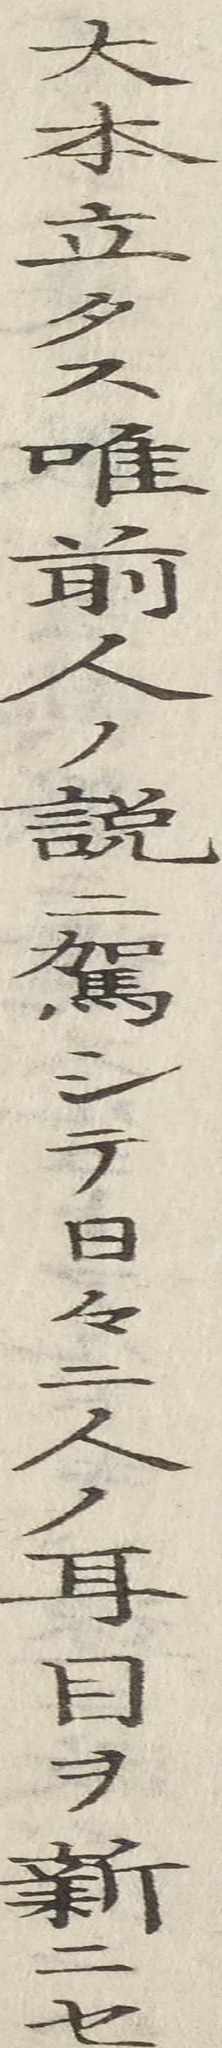大本立タス唯前人ノ説ニ駕シテ日々ニ人ノ耳目ヲ新ニセ
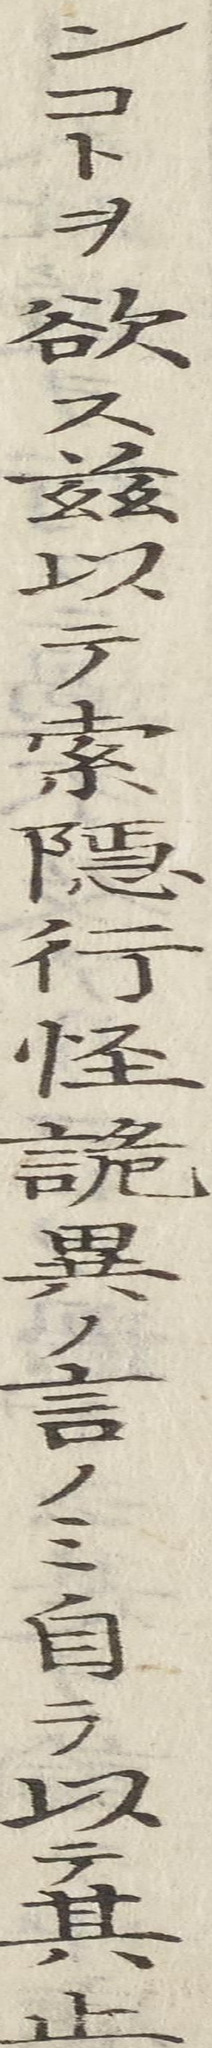ンコトヲ欲ス茲以テ索隠行怪詭異ノ言ノミ自ラ以テ其止
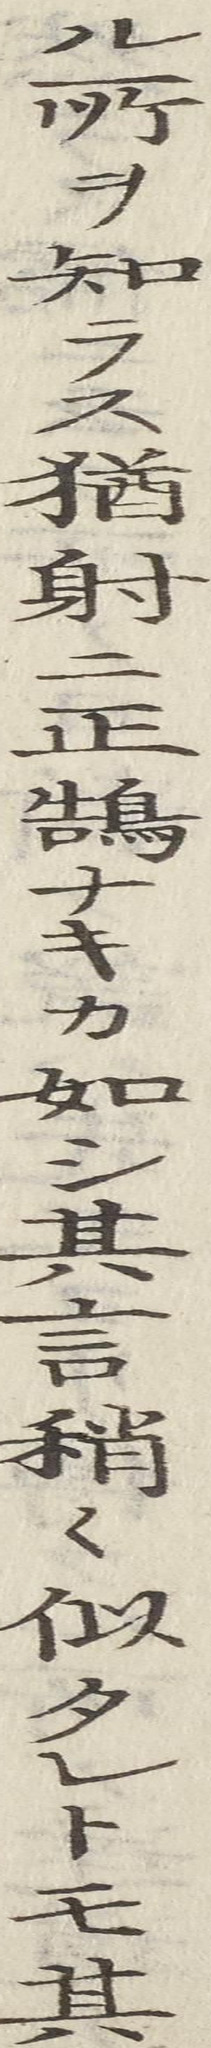ル所ヲ知ラス猶射ニ正鵠ナキカ如シ其言稍〱似タレトモ其
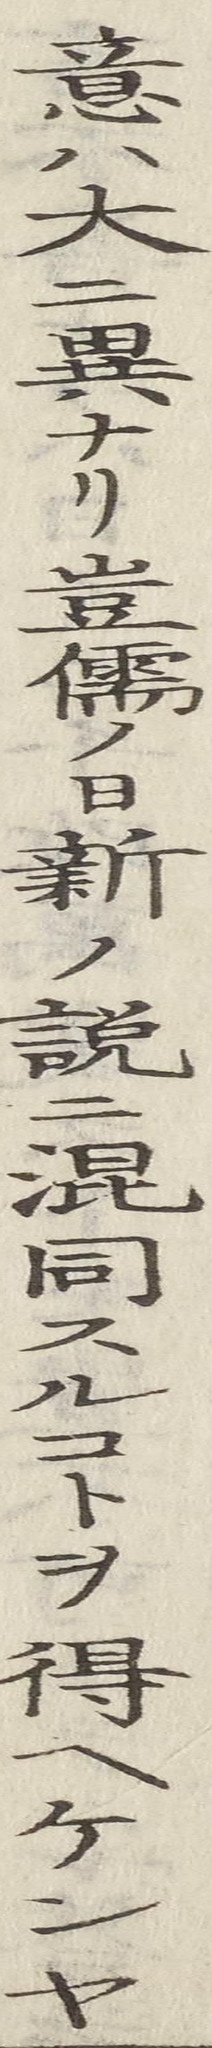意ハ大ニ異ナリ豈儒ノ日新ノ説ニ混同スルコトヲ得ヘケンヤ
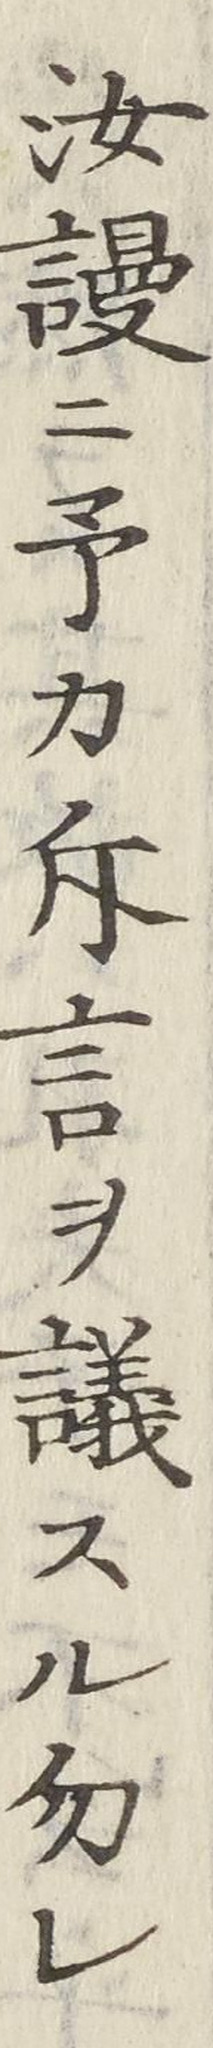汝謾ニ予カ斥言ヲ議スル勿レ
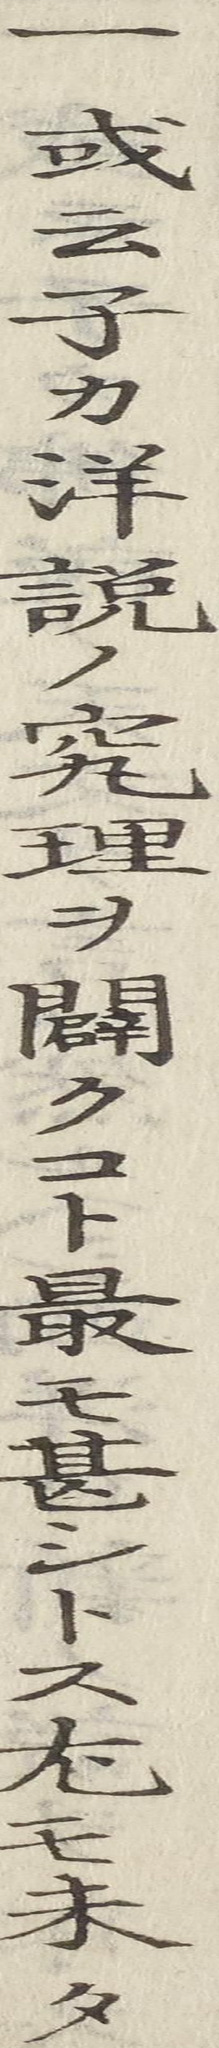一或云子カ洋説ノ究理ヲ闢クコトヲ最モ甚シトス尤モ未タ
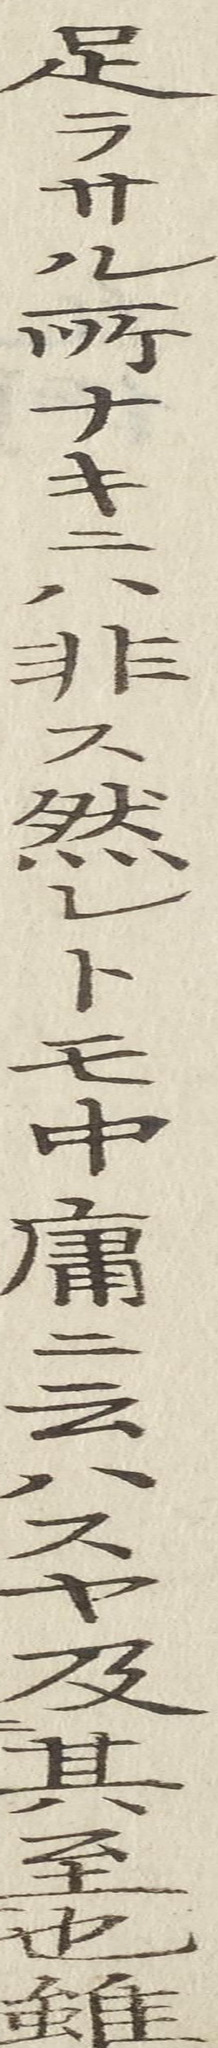足ラサル所ナキニハ非ス然レトモ中庸ニ云ハスヤ及ニ其至也雖ニ
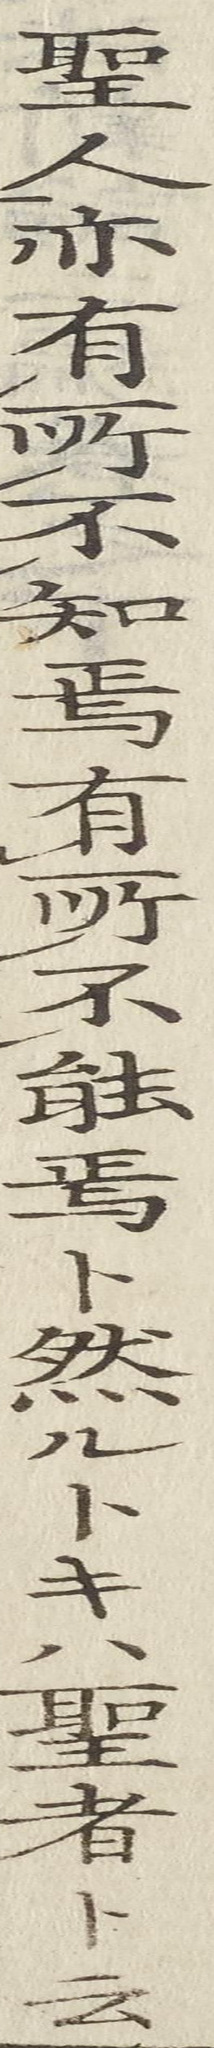聖人亦有所不知焉有所不能焉ト然ルトキハ聖者ト云
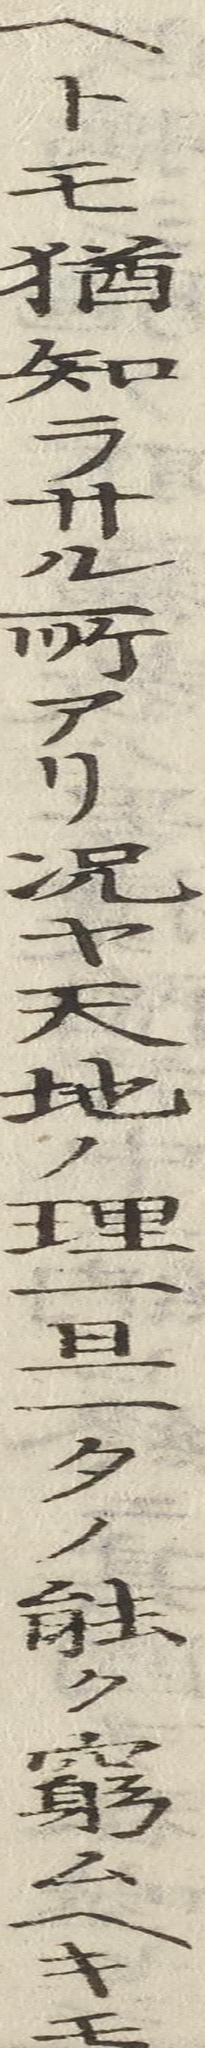ヘトモ猶知ラサル所アリ況ヤ天地ノ理一旦一夕ノ能ク窮ムヘキモ
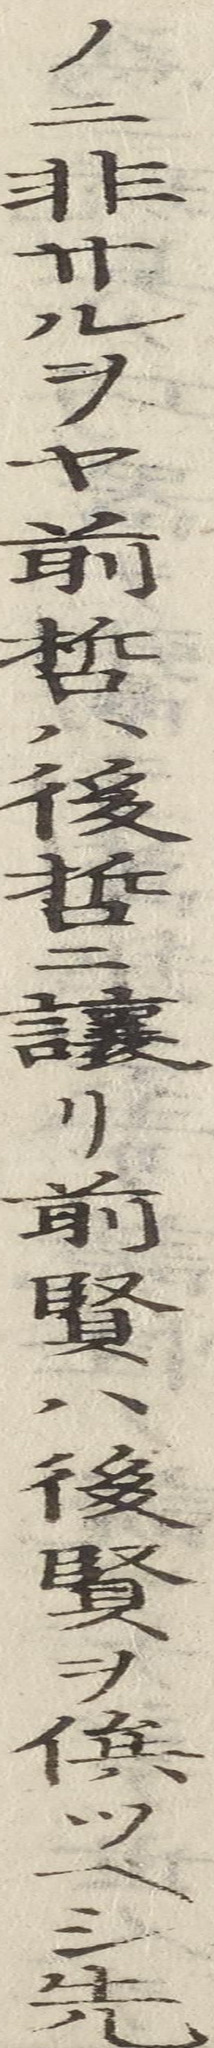ノニ非サルヲヤ前哲ハ後哲ニ譲リ前賢ハ後賢ヲ俟ツヘシ先
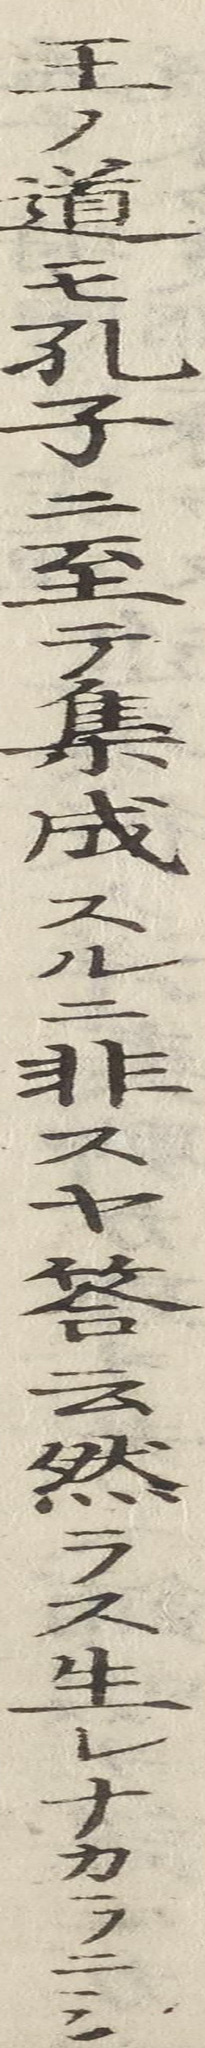王ノ道モ孔子ニ至テ集成スルニ非スヤ答云然ラス生レナカラニシ
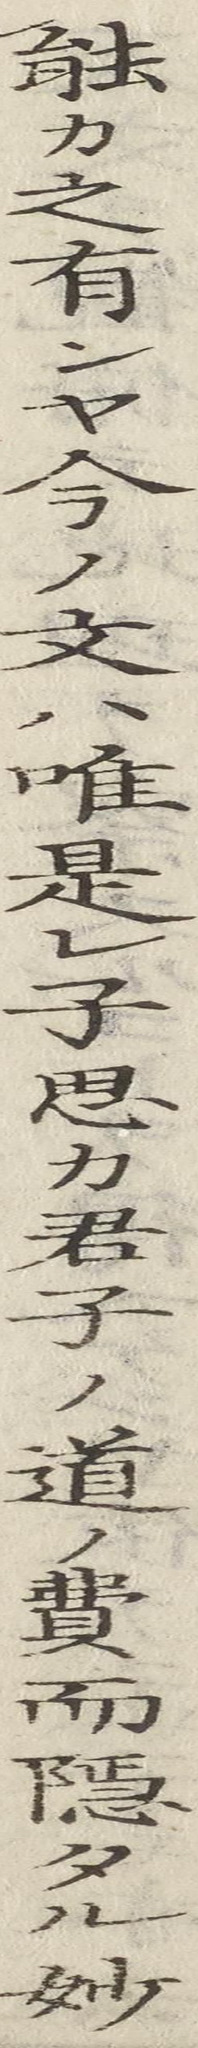能カ之有ンヤ今ノ文ハ唯是レ子思カ君子ノ道ノ費而隠タル妙
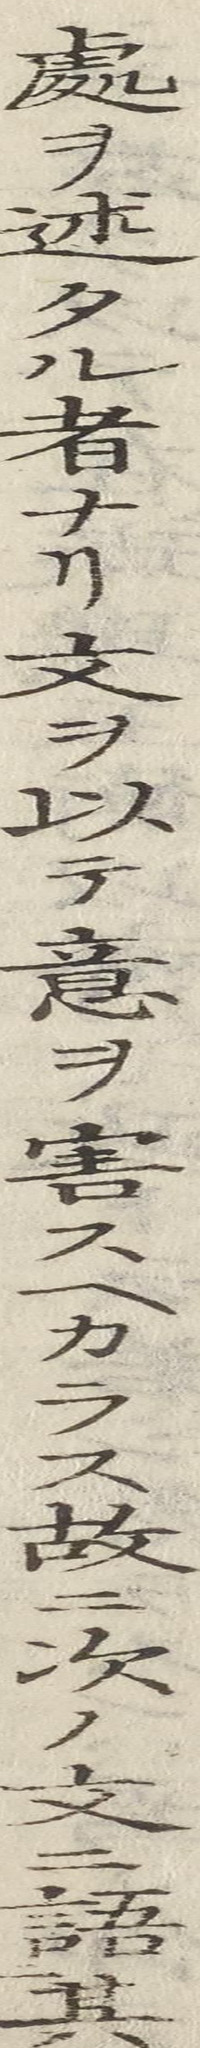処ヲ述タル者ナリ文ヲ以テ意ヲ害スヘカラス故ニ次ノ文ニ語ニ其
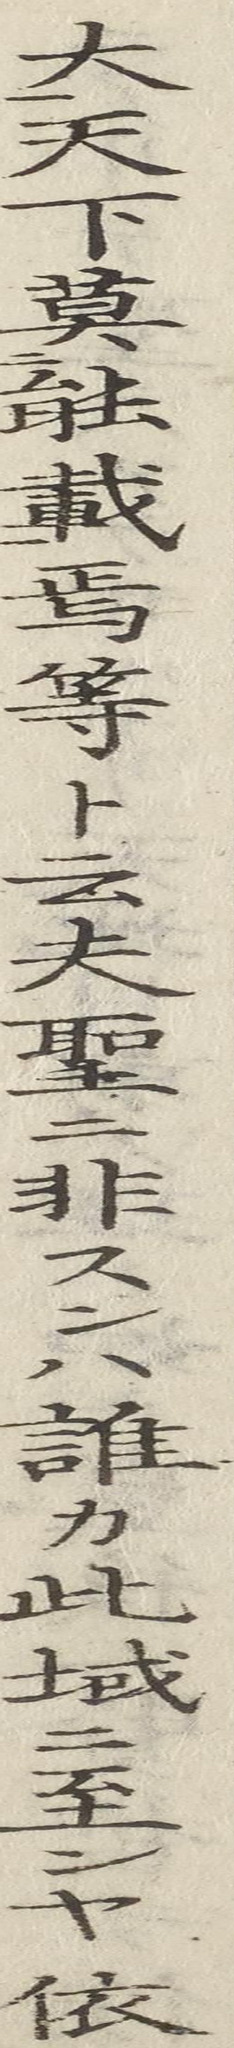大天下莫ニ能載焉等ト云夫聖ニ非スンハ誰カ此域ニ至ンヤ依
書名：護法新論　二編　下
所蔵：東京大学地震研究所図書室 Earthquake Research Institute Library, The University of Tokyo, JAPAN
